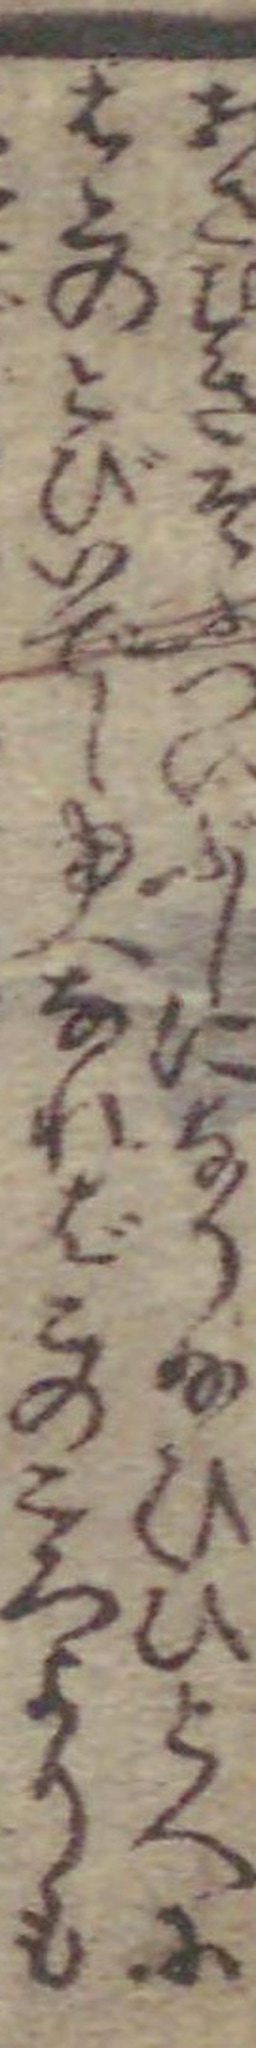はとのとびいでしゆへなればこのころよりも
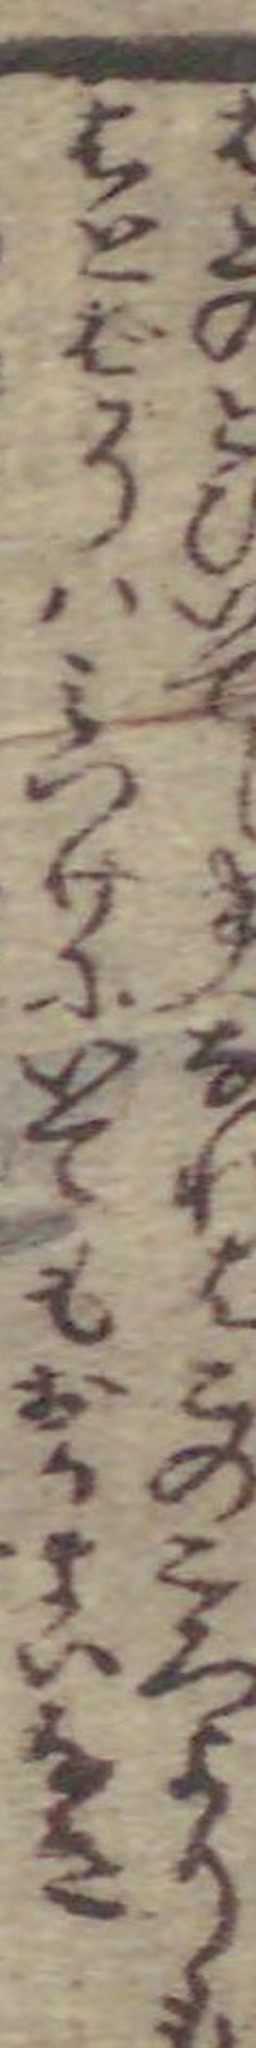はとばかりハミつけにいてもおかまいなき
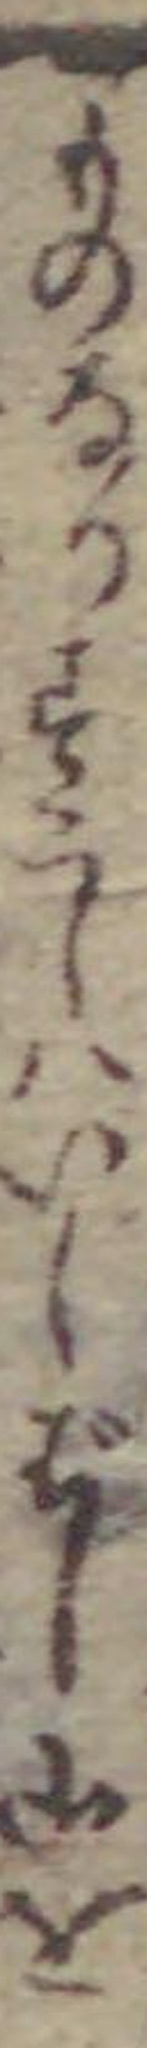ものなりすこしハいしばし山を
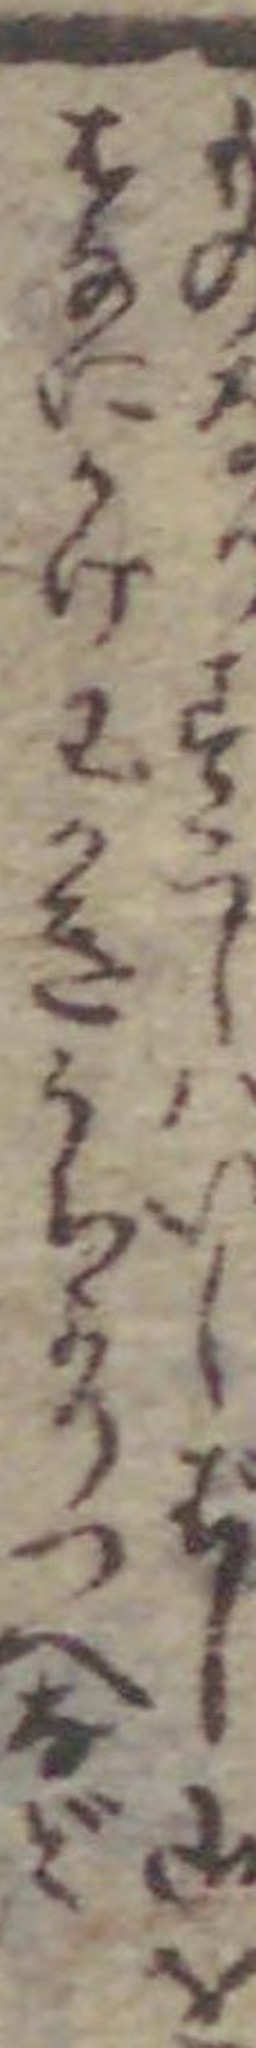はなにかけわかきうちよりつへなど
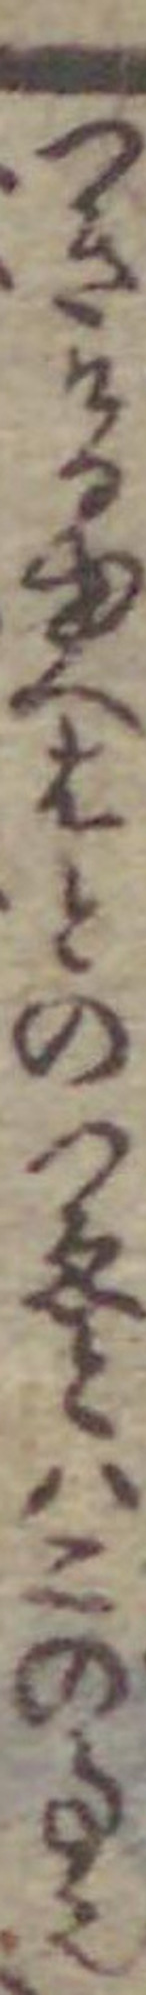つきけるゆへはとのつゑとハこの事也
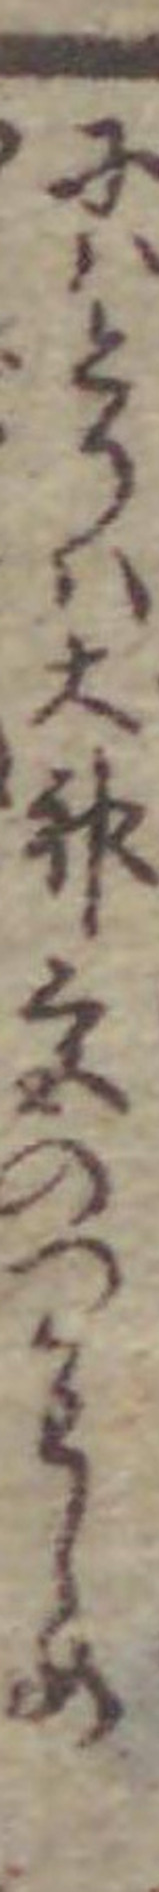にはとりハ大神宮のつかわしめ
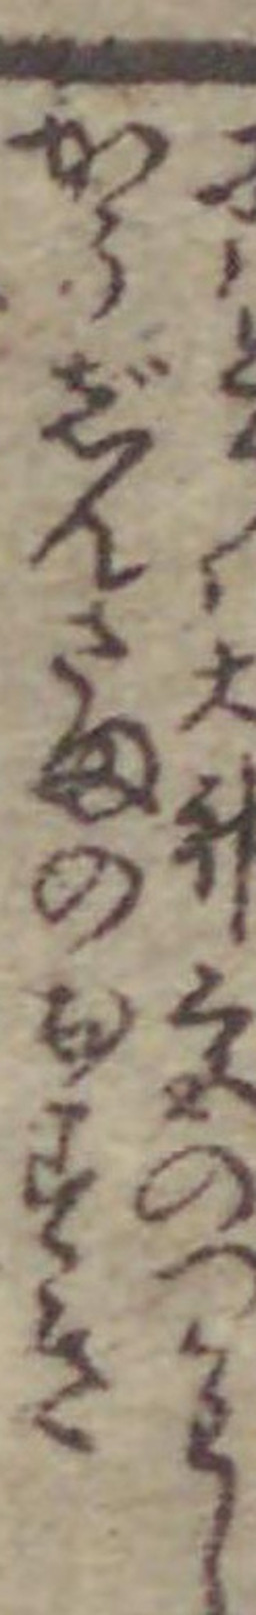かうじんさまのおすき
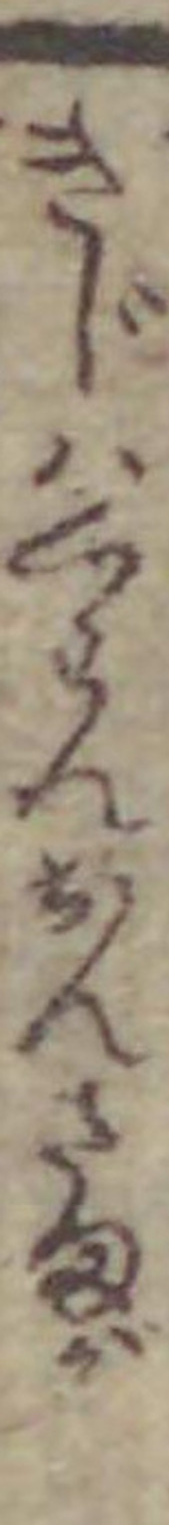きじハくわんおんさまが
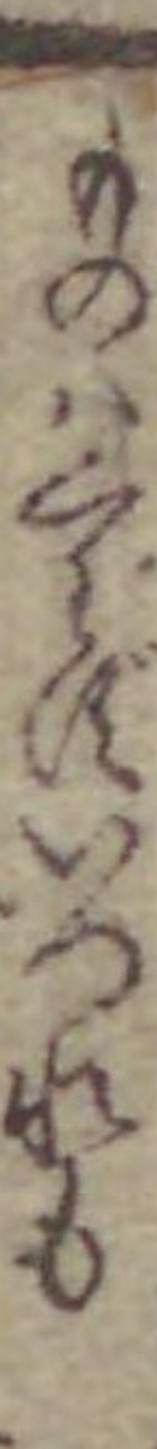ものハくわずいつれも
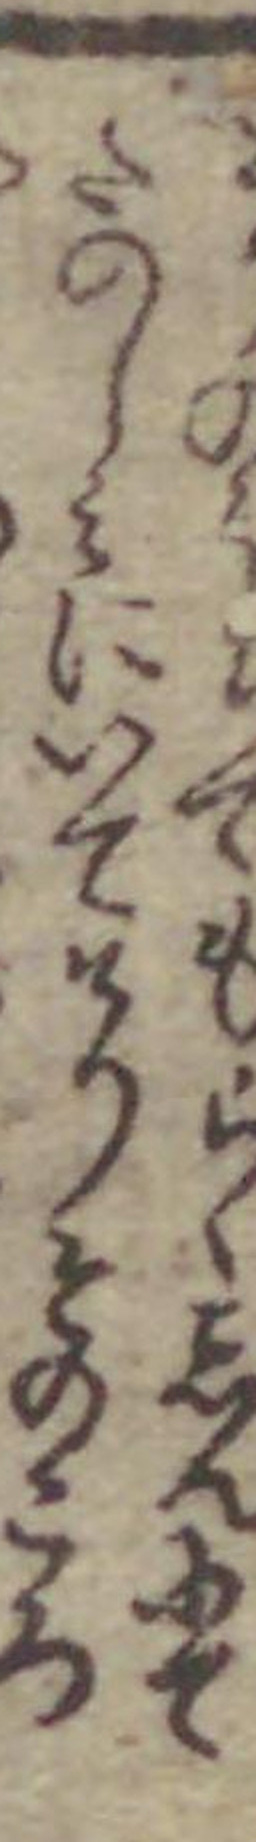たのしミにいてけりそのころ
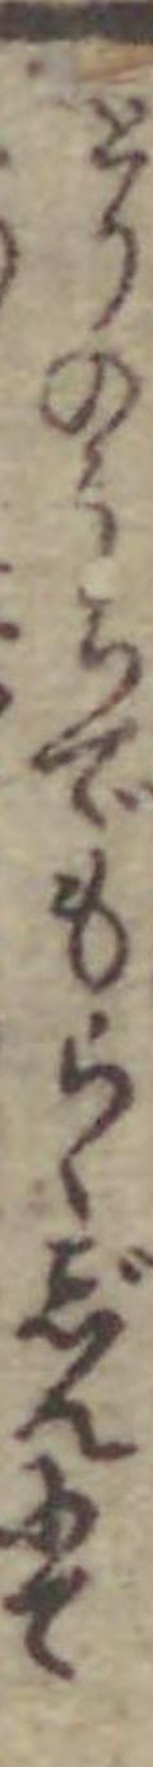とりのうちでもらくじんにて
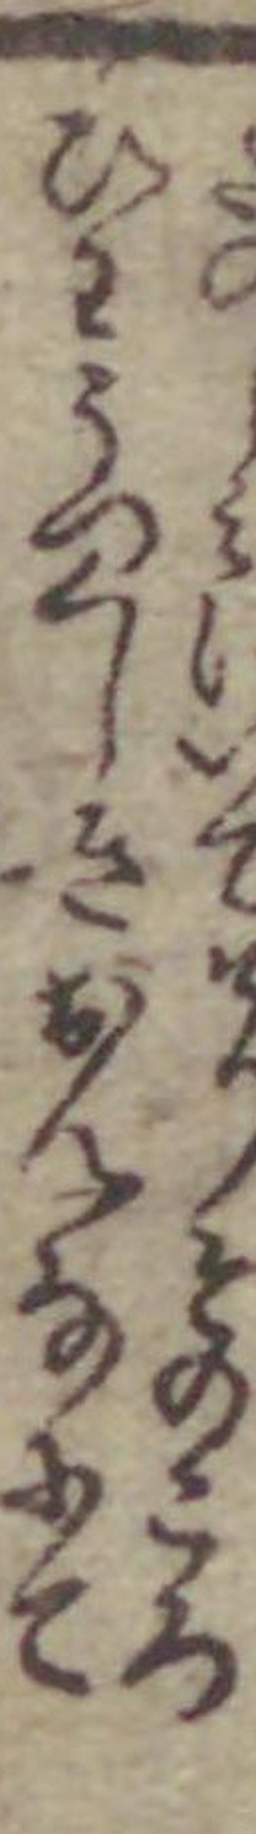ひわうつくしきおんなにて
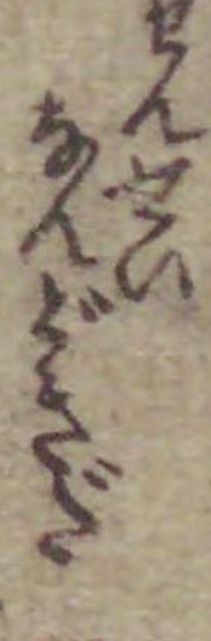なんどきだ
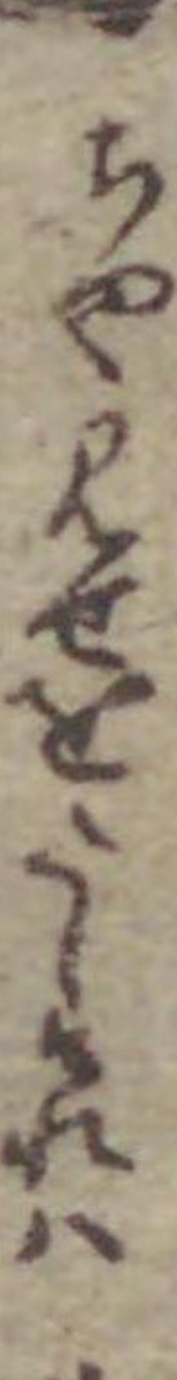ちやみせをたしけれハ
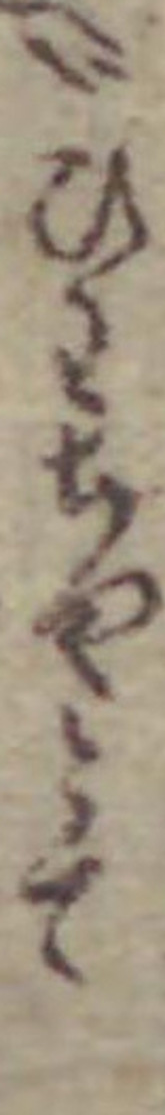ひわちやとて
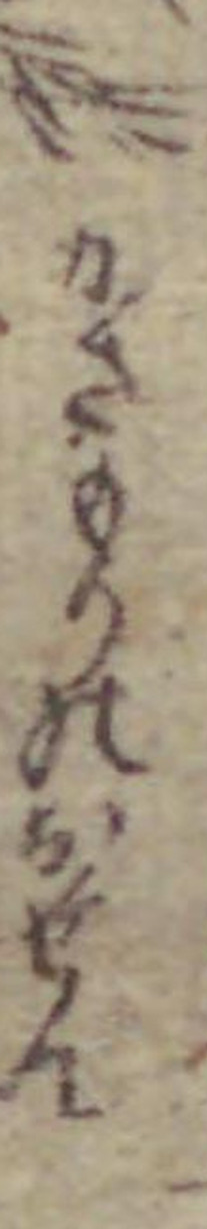かさもりのおせん
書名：烏行水諺草 3巻
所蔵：国立国会図書館 National Diet Library, JAPAN
